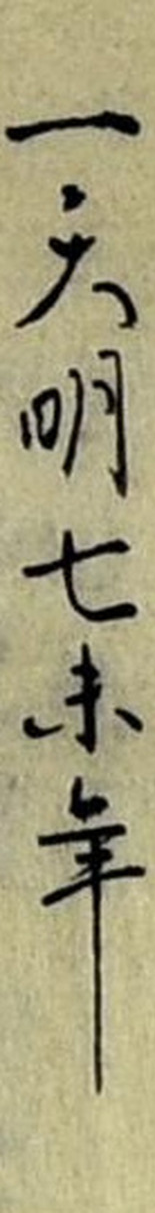一天明七未年
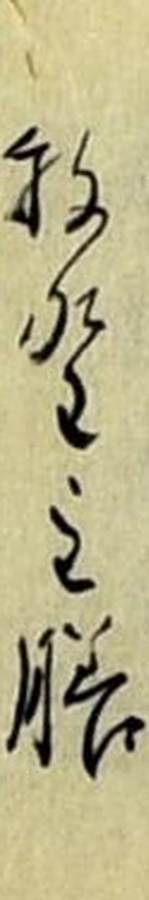牧野主膳
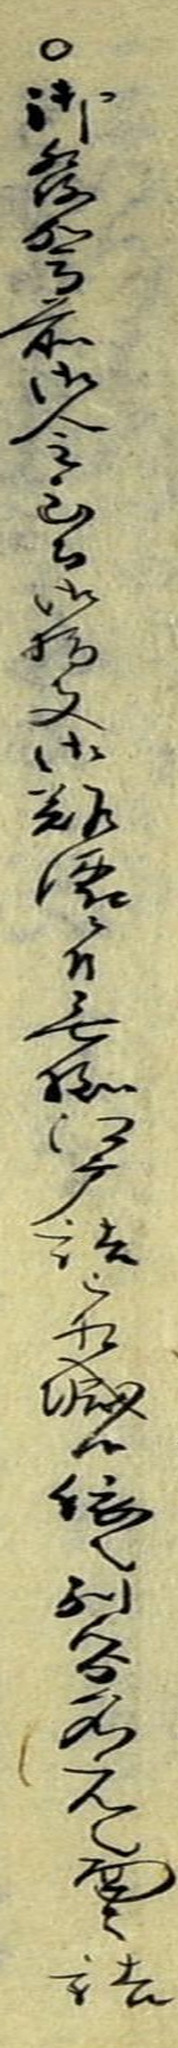〇御発駕前御金至而御指支御難渋に付無拠江戸詰被相減候依之別紙名元之面々詰
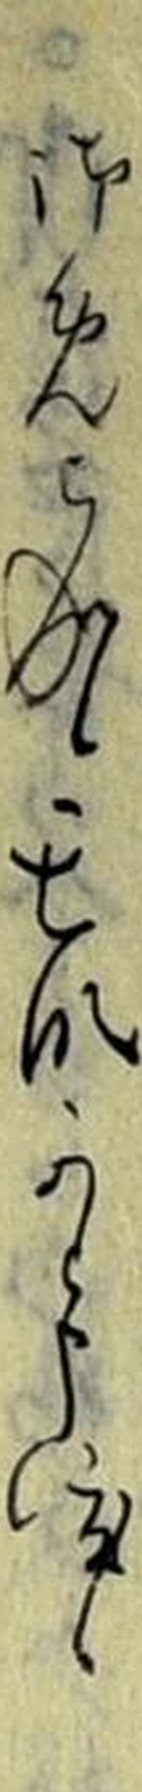御免被成候其段可被申渡候
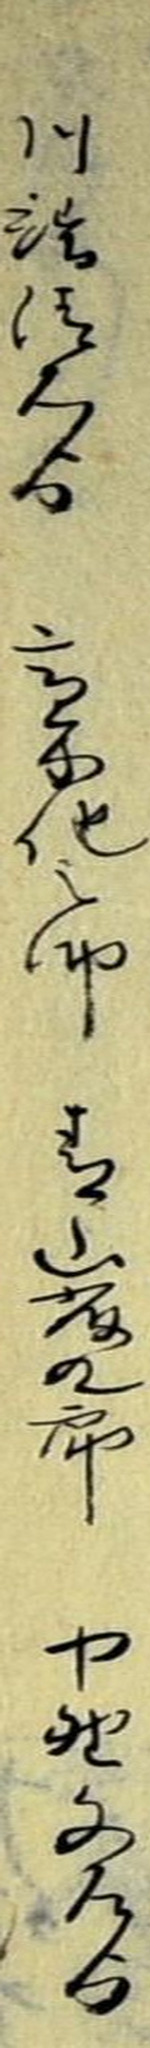川端清右衛門高木他之助青山藤九郎中野文左衛門
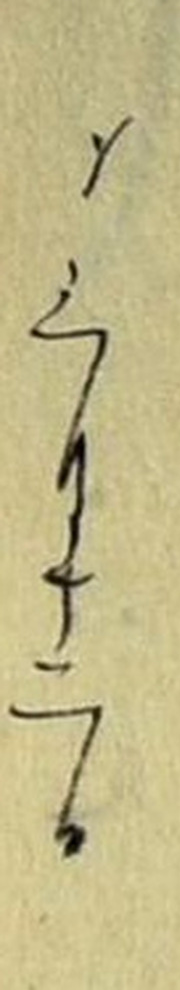〆三月十二日

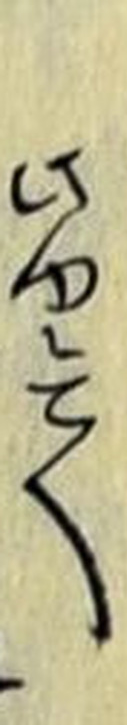此内壱人
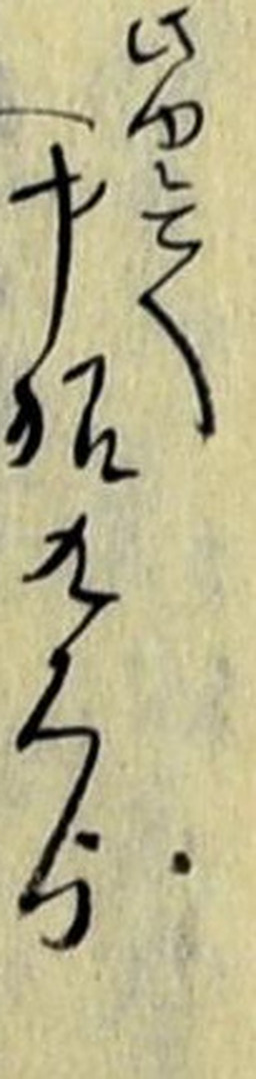中根九右衛門
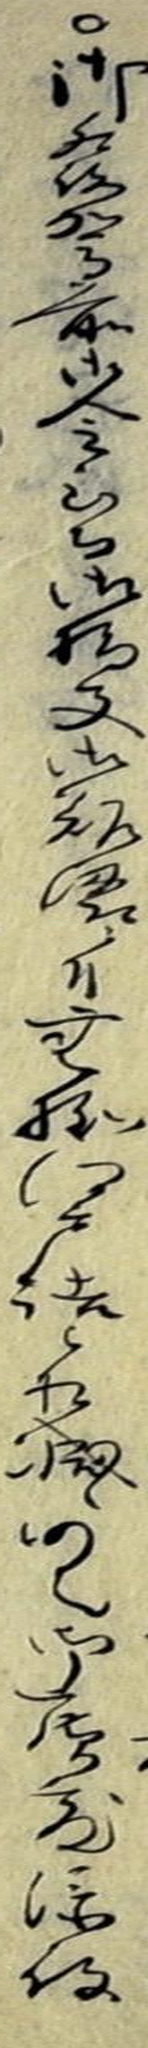〇御発駕前御金至而御指支御難渋に付無拠江戸詰被相減候仍之御広敷添役
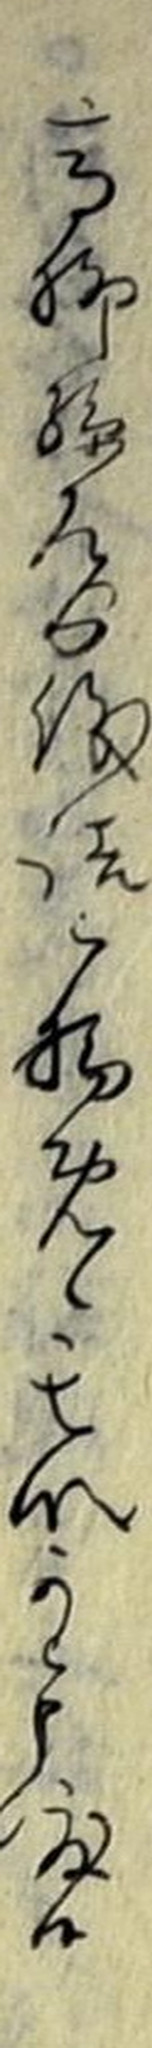高柳孫左衛門儀詰被指免候其段可被申渡候
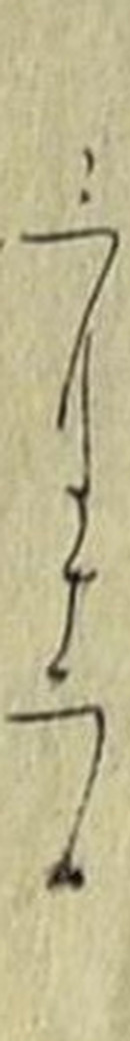三月十二日
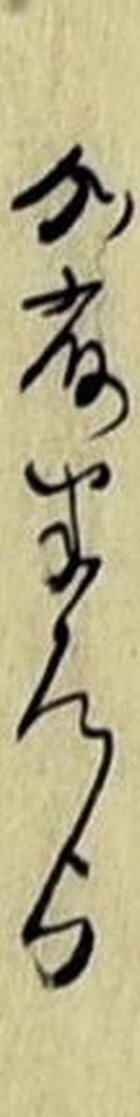加藤半左衛門
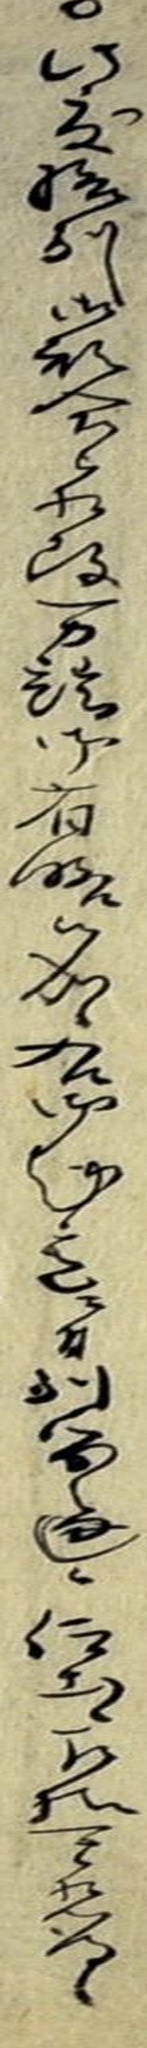〇此度格別御形合被相改万端御省略被成候右御趣意に付別紙之通被仰出候左様可被相心得候
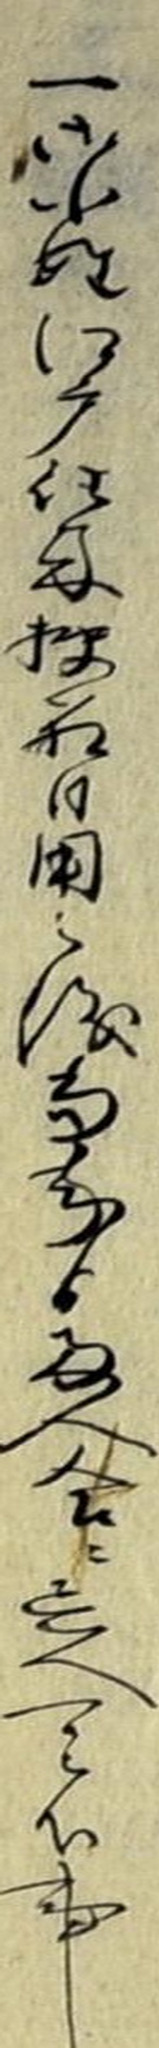一御小姓江戸往来挟箱日用之儀当年ゟ両人合に壱人可被下事
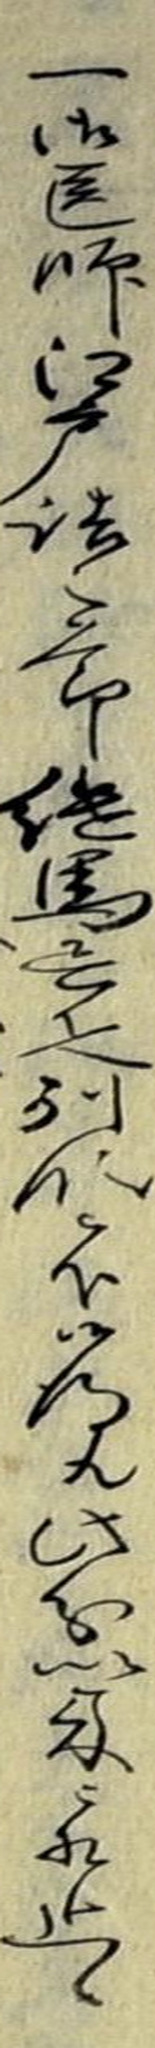一御医師江戸詰之節継馬壱疋別段被下候得共此分以来被相止候
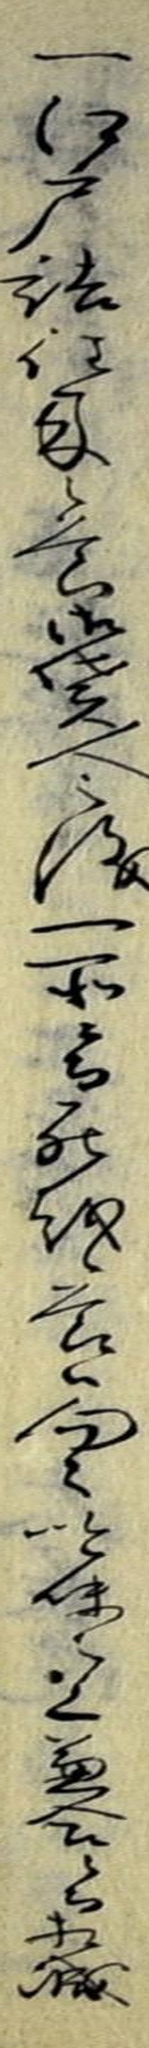一江戸詰往来之節御貸人之儀一所に而罷越候節は向々吟味之上兼合に而相減
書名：命令之部 二
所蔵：福井県文書館 Fukui Prefectural Archives
